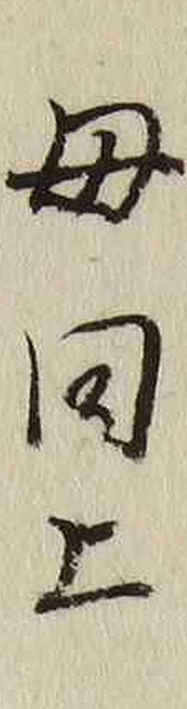母同上
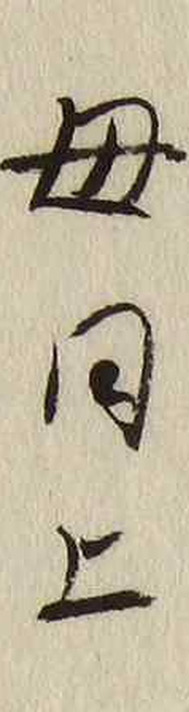母同上
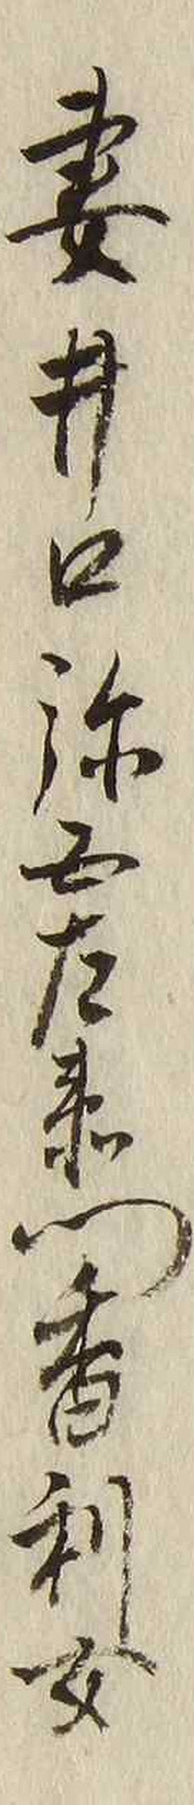妻井口弥五左衛門香利女

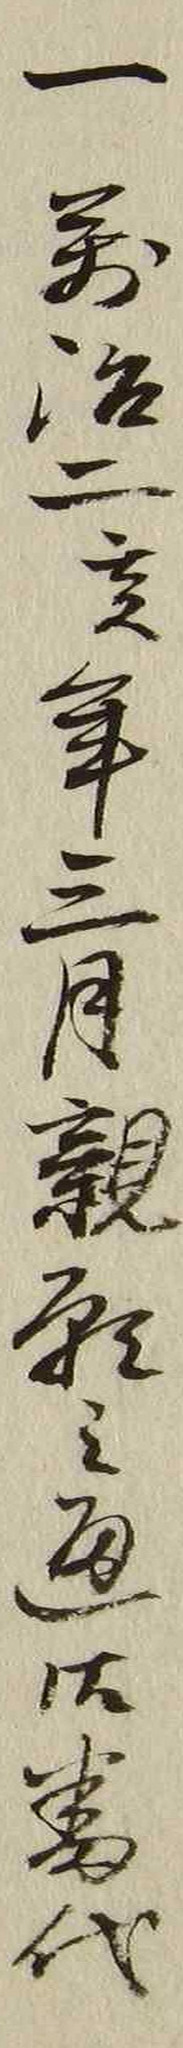一万治二亥年三月親願之通御番代
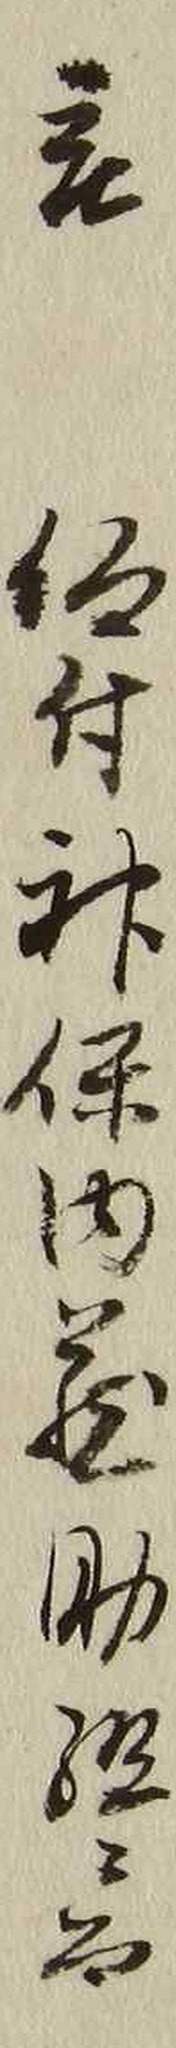被仰付神保内蔵助組ニ而
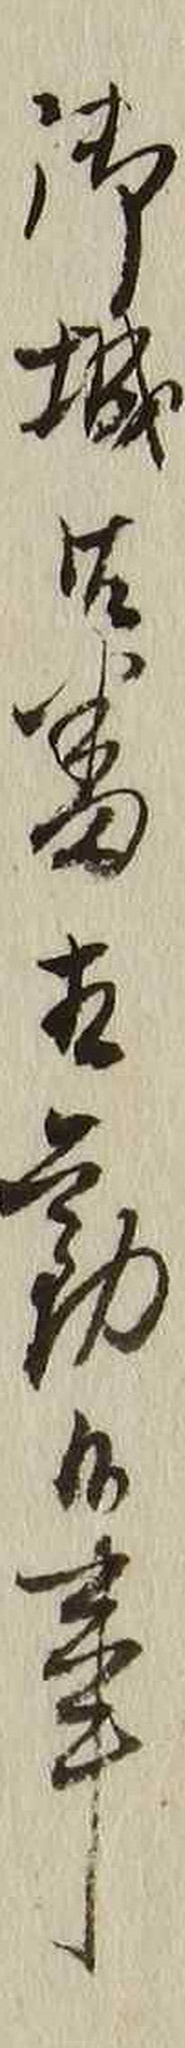御城御番相勤候事
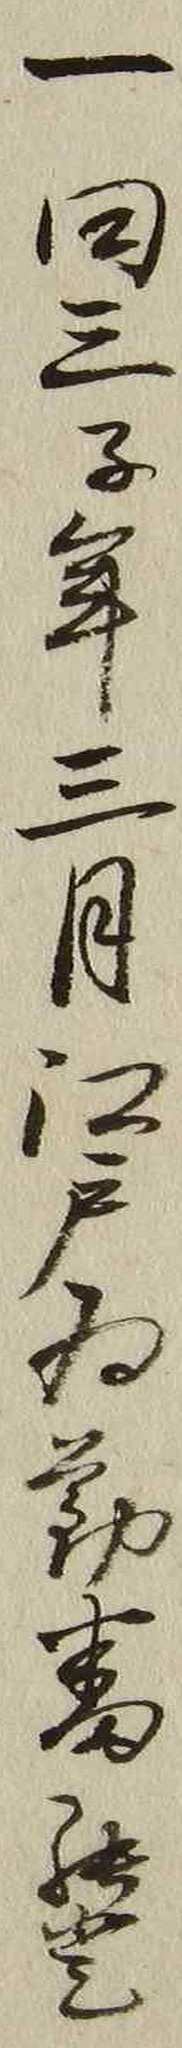一同三子年三月江戸為勤番罷登
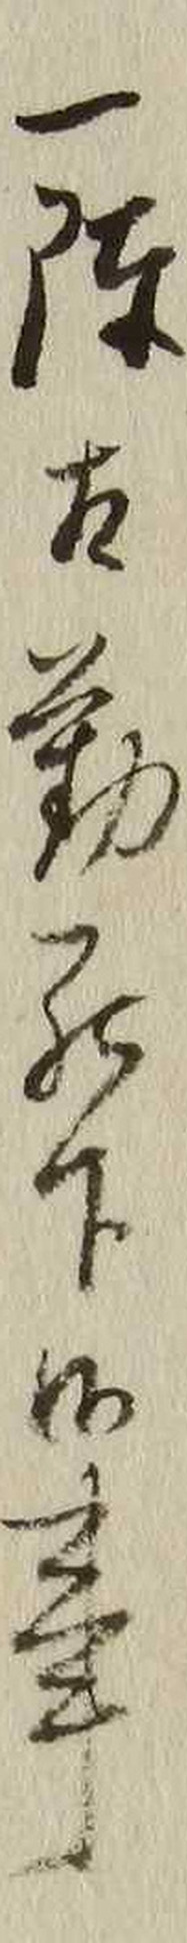一陣相勤罷下候事
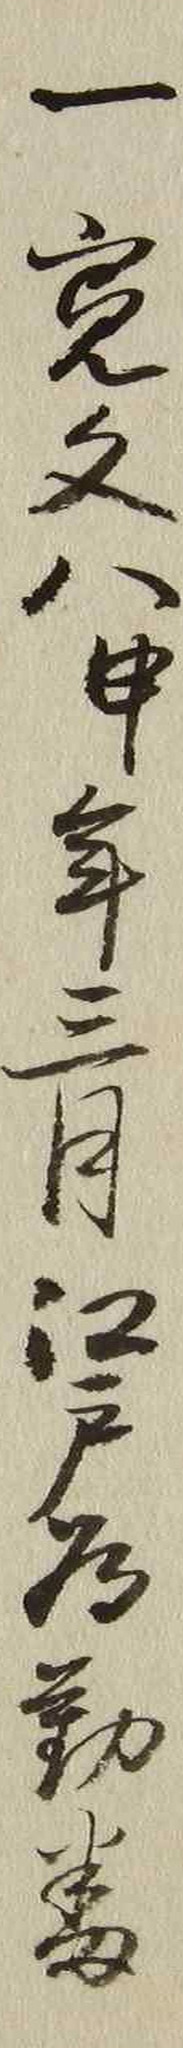一寛文八申年三月江戸為勤番
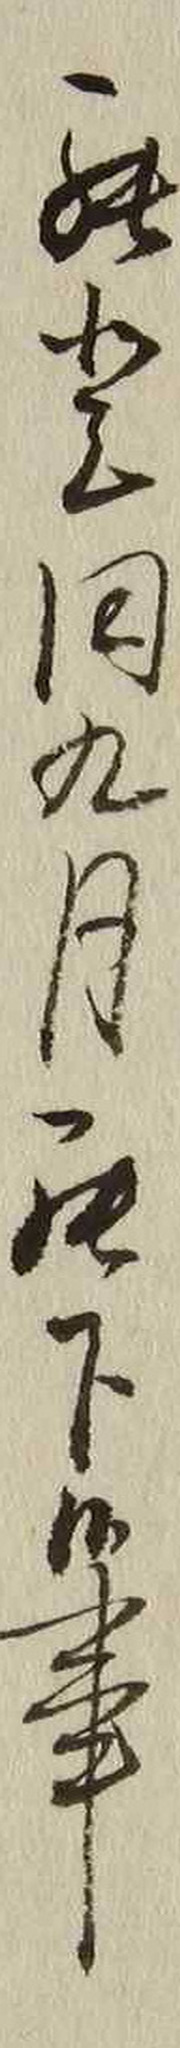罷登同九月罷下候事
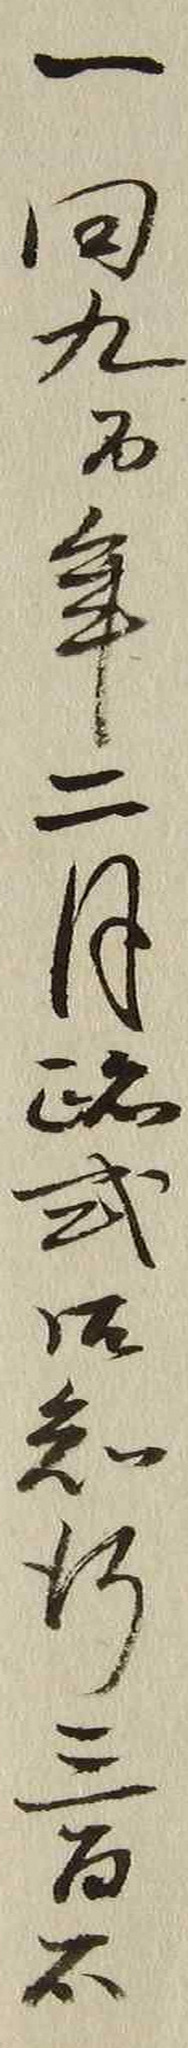一同九酉年二月跡式御知行三百石
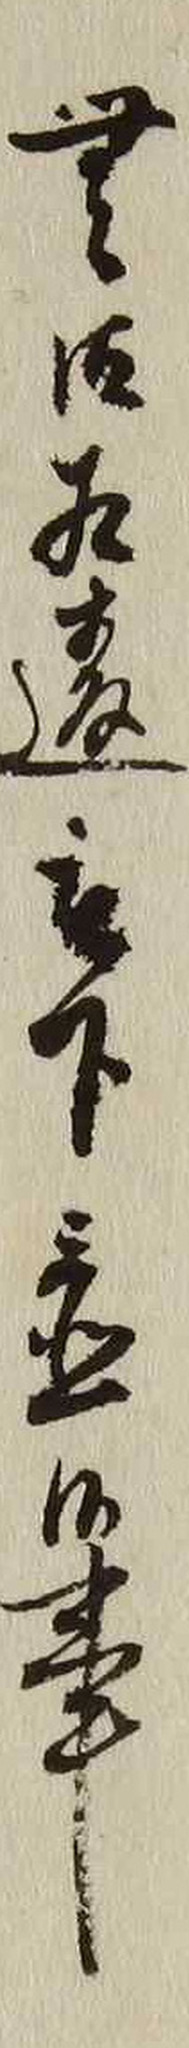無御相違被下置候事
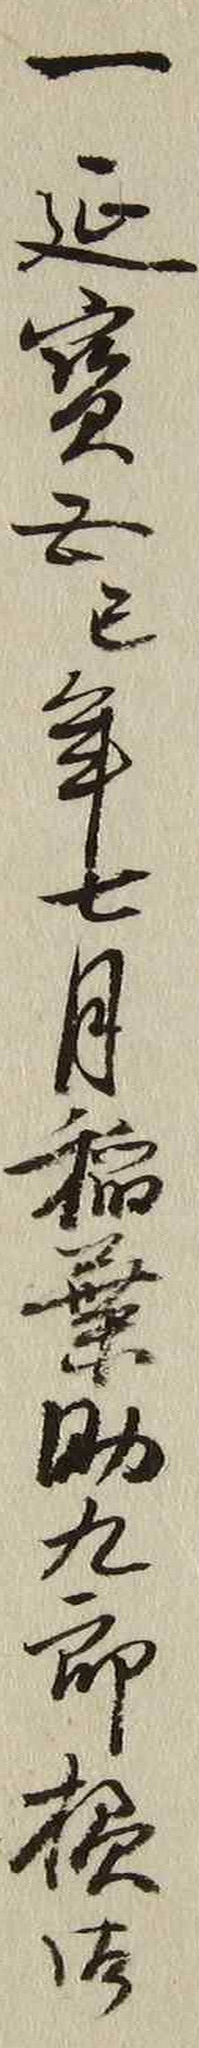一延宝五巳年七月稲葉助九郎様御
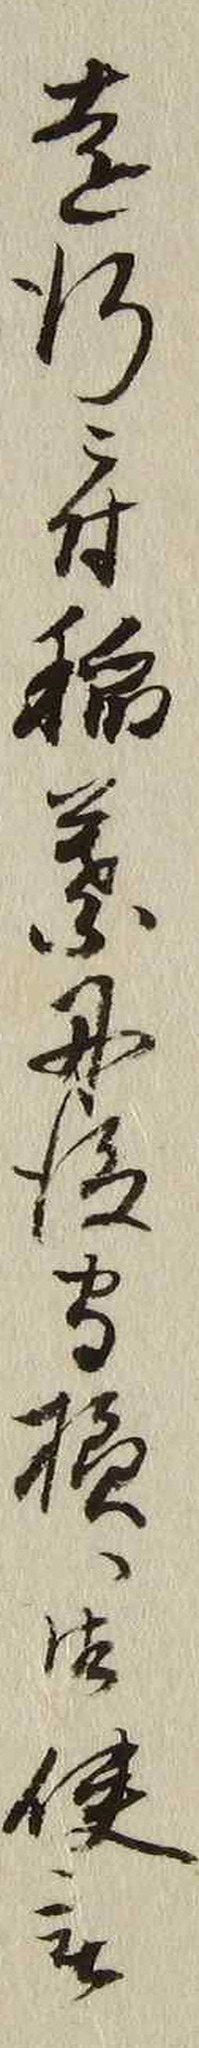遠行ニ付稲葉丹後守様へ御使被
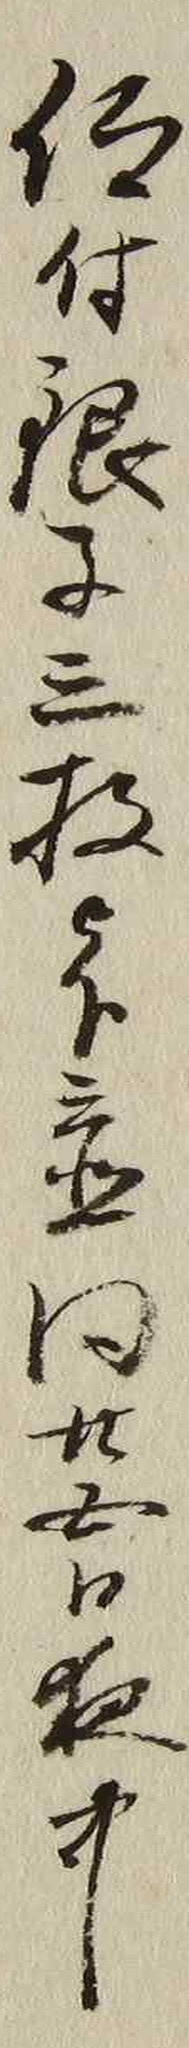仰付銀子三枚被下置同廿五日夜中
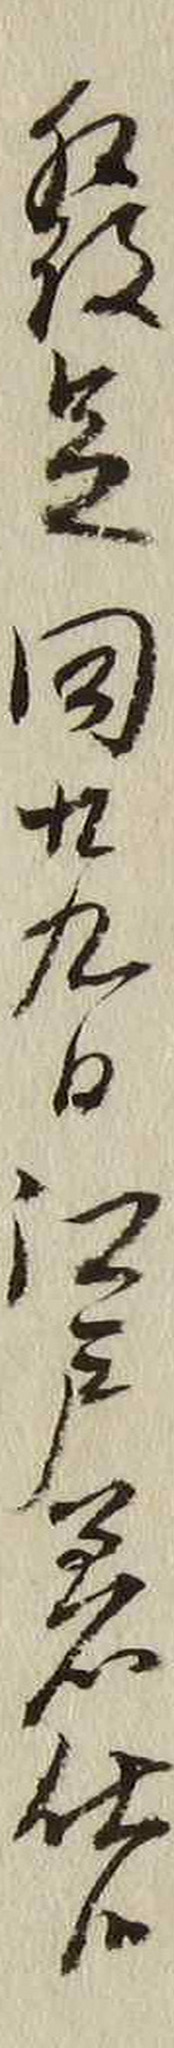発足同廿九日江戸着仕候
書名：諸士系譜　巻之356　す之部6
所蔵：会津若松市立会津図書館
